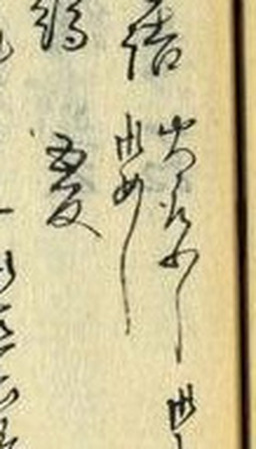御めし
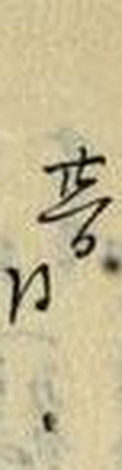廿九日
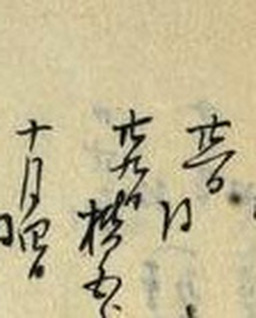廿九日
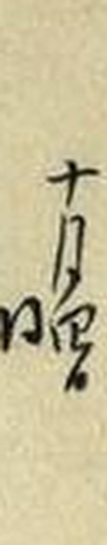十月四日
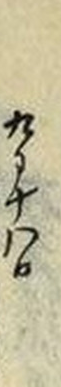九月十八日
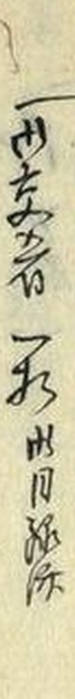御交肴一折御目録済
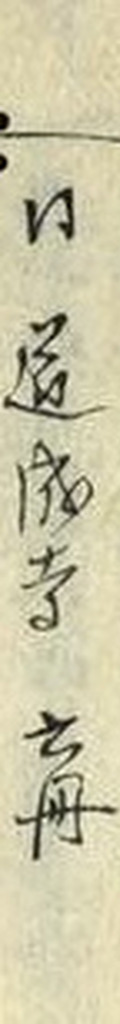同道成寺六冊
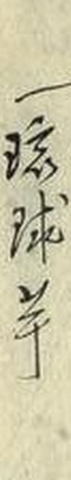琉球芋
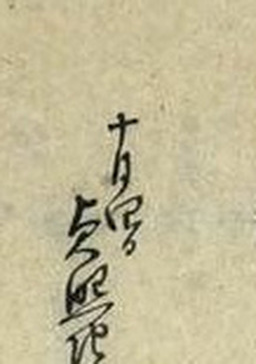十月四日
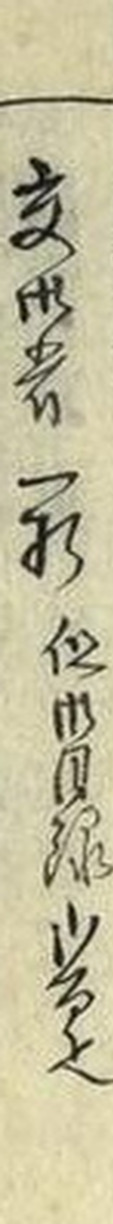交御肴一折但御目録弐百疋

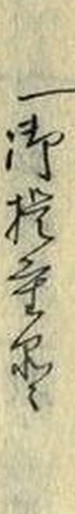御提重品々
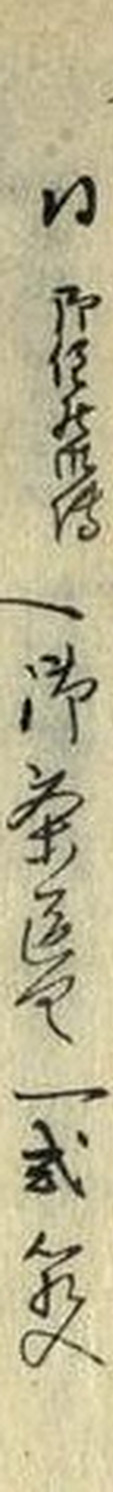同同御住居御伝御茶道具一式箱入
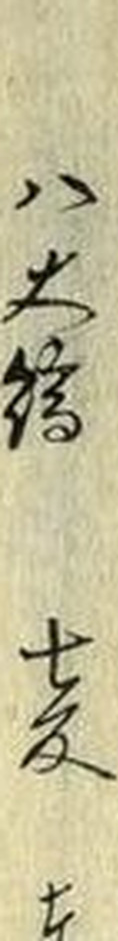拝領八丈縞七反
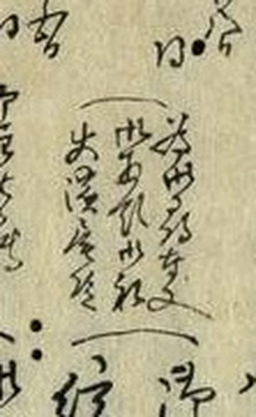御拝領御礼
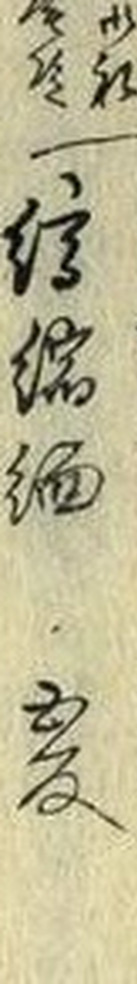縞縮緬五反
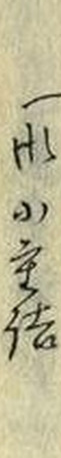御小重詰
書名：少傅日録抄（斉善付側向頭取日記、在府）
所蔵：福井県文書館 Fukui Prefectural Archives
